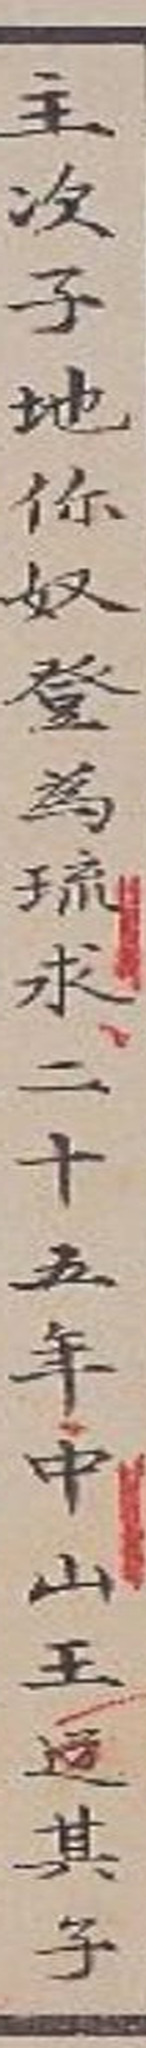主次子地儞奴登為琉求、二十五年、中山王遣其子
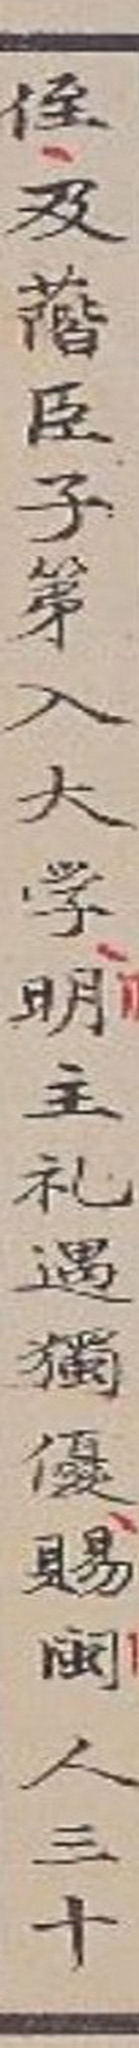侄、及臣子弟入大学、明主礼遇独優、賜閩人三十
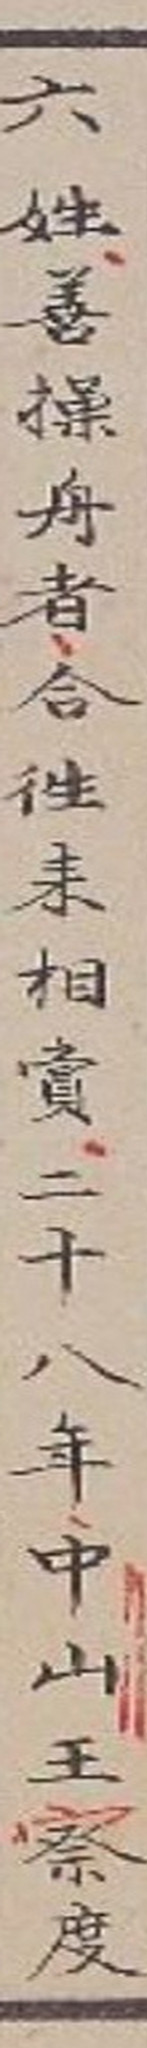六姓、善操舟者、合往来相賞、二十八年、中山王察度
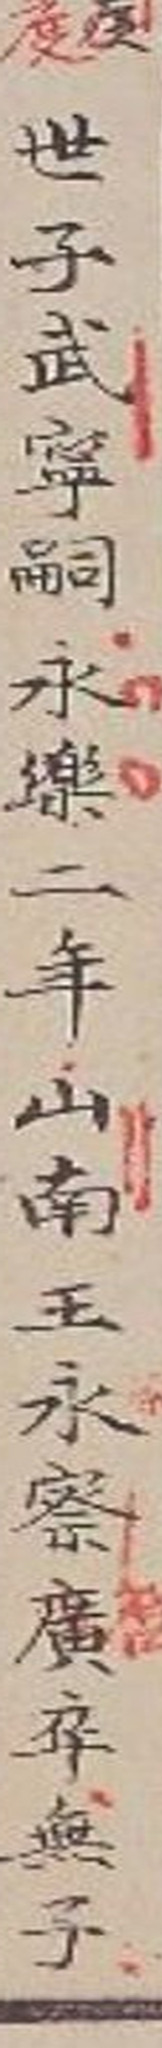察度也世子武寧嗣、永楽二年山南王永察広度卒、無子、
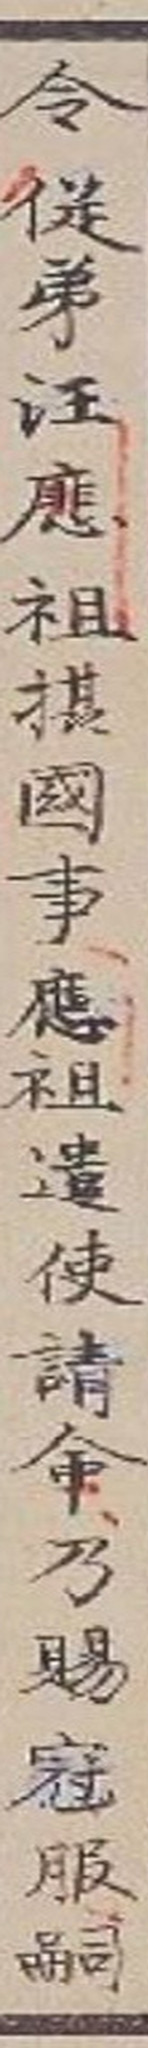令従弟汪応祖摂国事、応祖遣使請命、乃賜冠服嗣
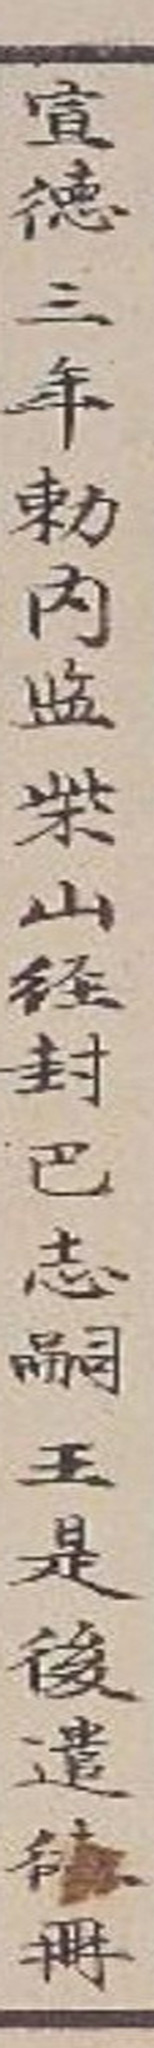宣徳三年勅内監柴山経封巴志嗣王是後遣冊
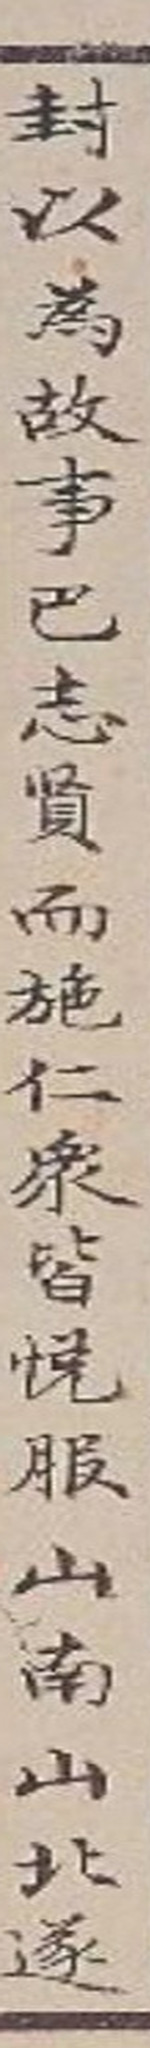封以為故事巴志賢而施仁衆皆悦服山南山北遂

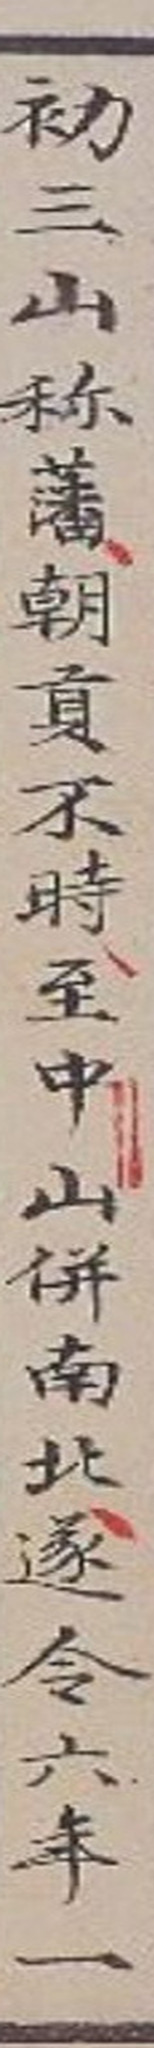初三山称藩、朝貢不時、至中山併南北、遂令六年一
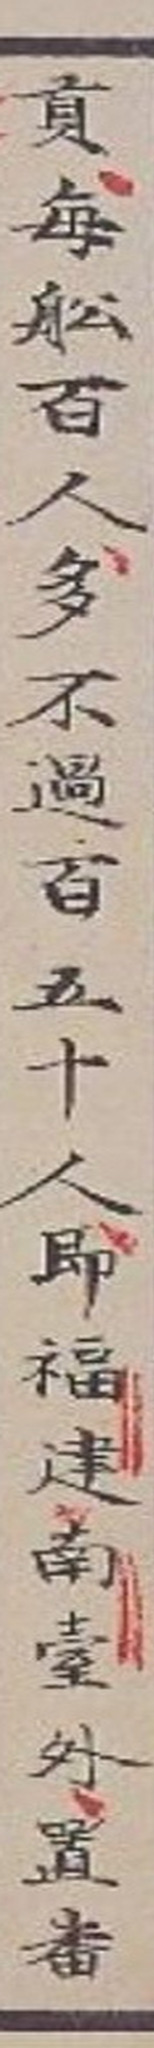貢、毎船百人、多不過百五十人、即福建南台外、置番
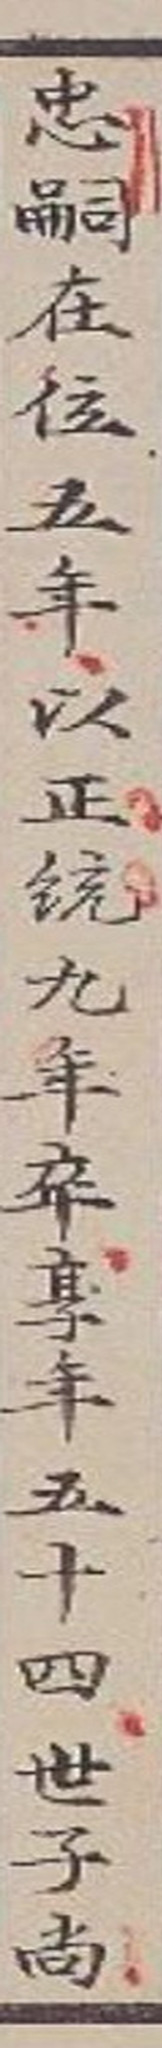忠嗣在位五年、以正統九年卒、享年五十四、世子尚
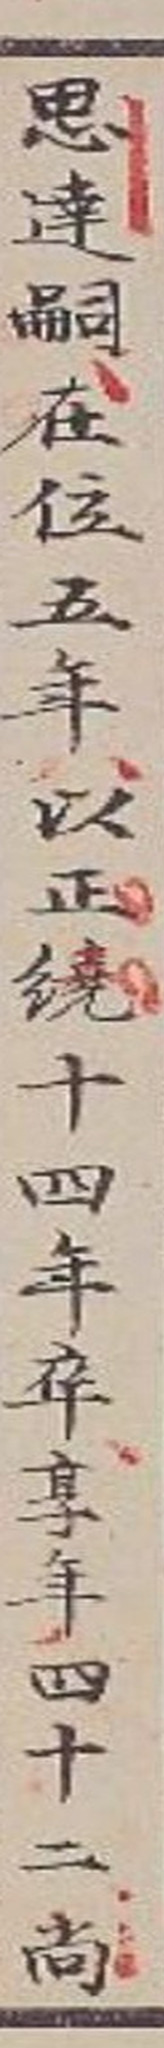思達嗣、在位五年、以正繞統十四年卒、享年四十二尚
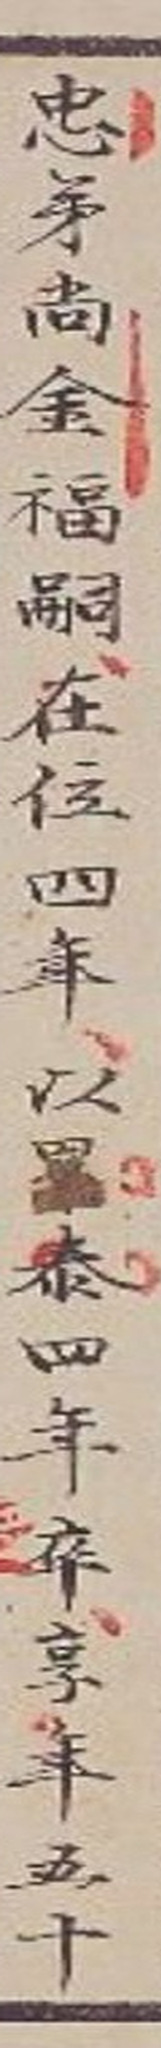忠弟尚金福嗣、在位四年、以景泰四年卒、享年五十
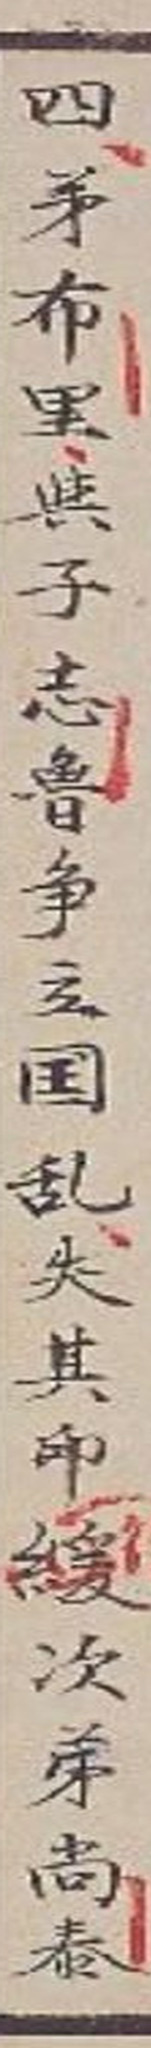四、弟布里、与子志魯争立国乱、失其印緩綬次弟尚泰
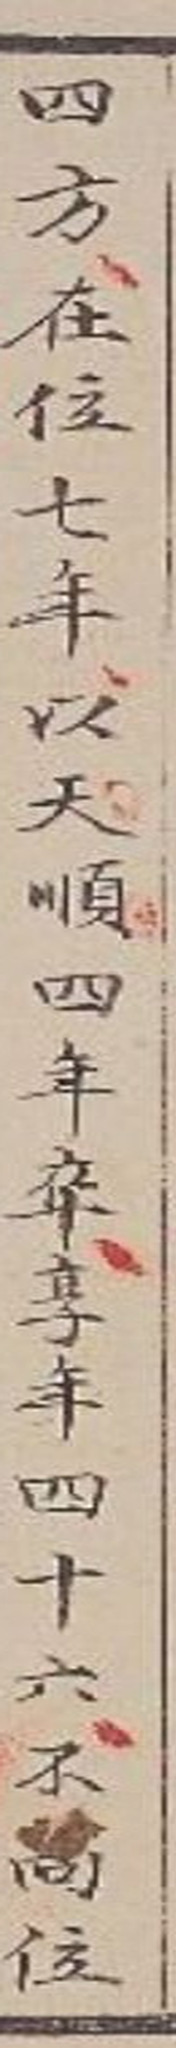四方、在位七年、以天順四年卒、享年四十六、不尚位
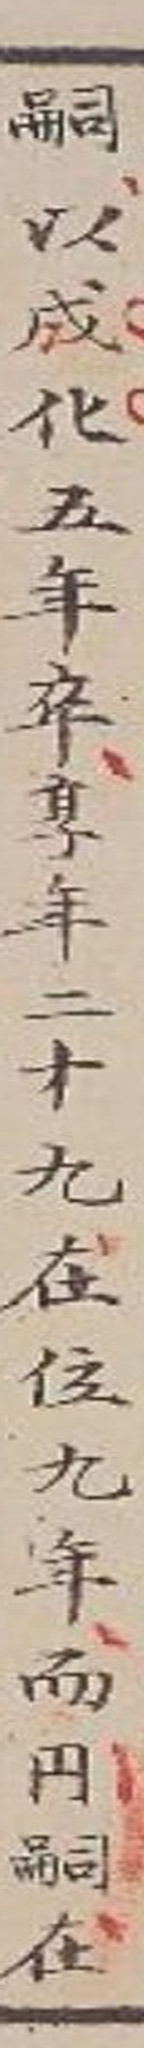嗣、以成化五年卒、享年二十九、在位九年、而円嗣、在

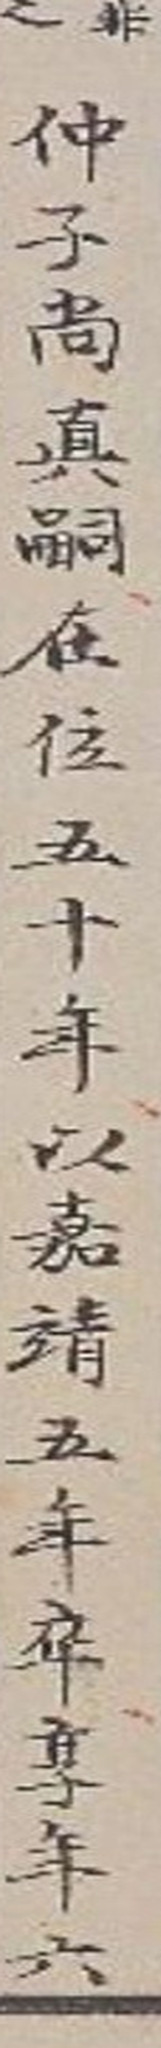非也仲子尚真嗣、在位五十年、以嘉靖五年卒、享年六
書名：南島志 全
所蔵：University of the Ryukyus Library
